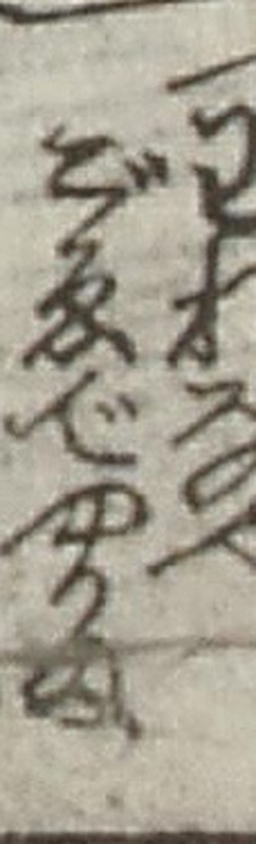ごゑでやかま
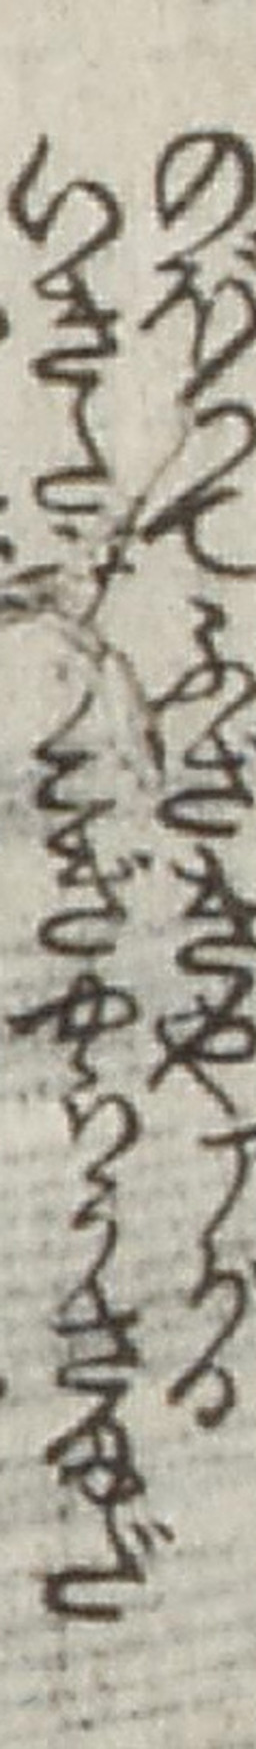いきたすりこぎやらうさまだ
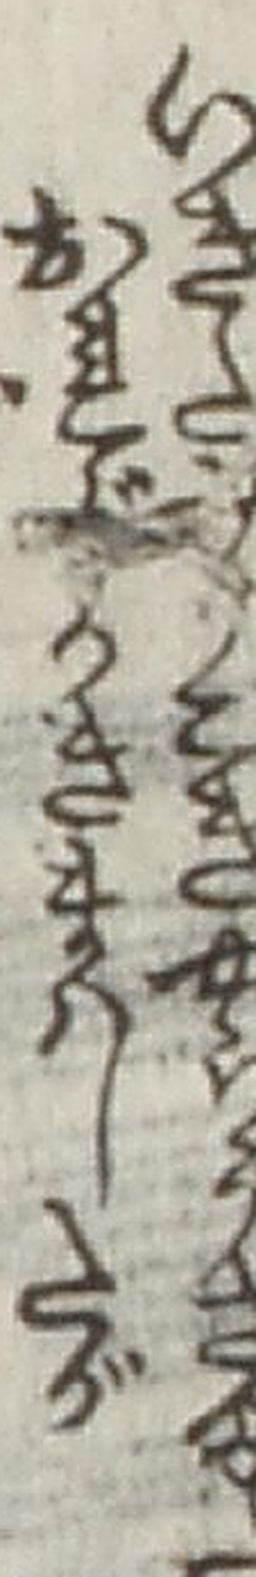おれがかきまはしたが
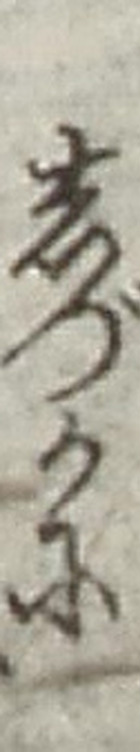しづかに
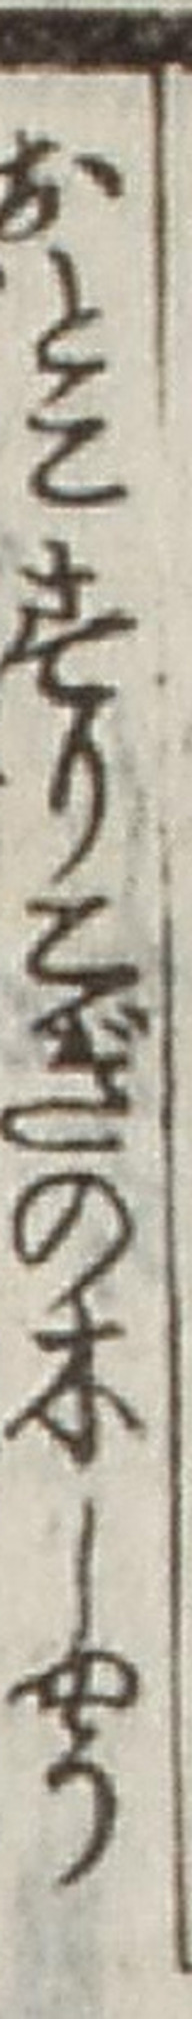おとこすりこきの木しやう
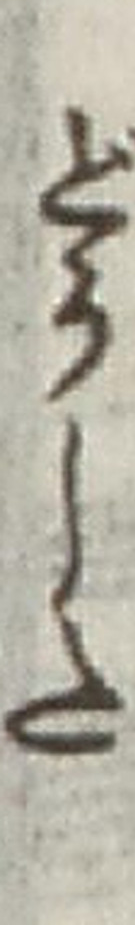どうした
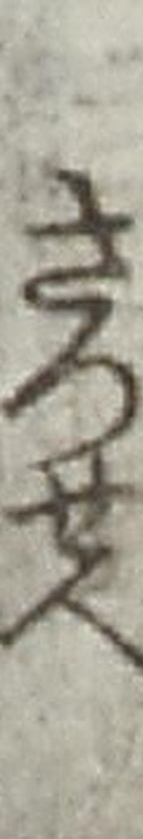さつせへ
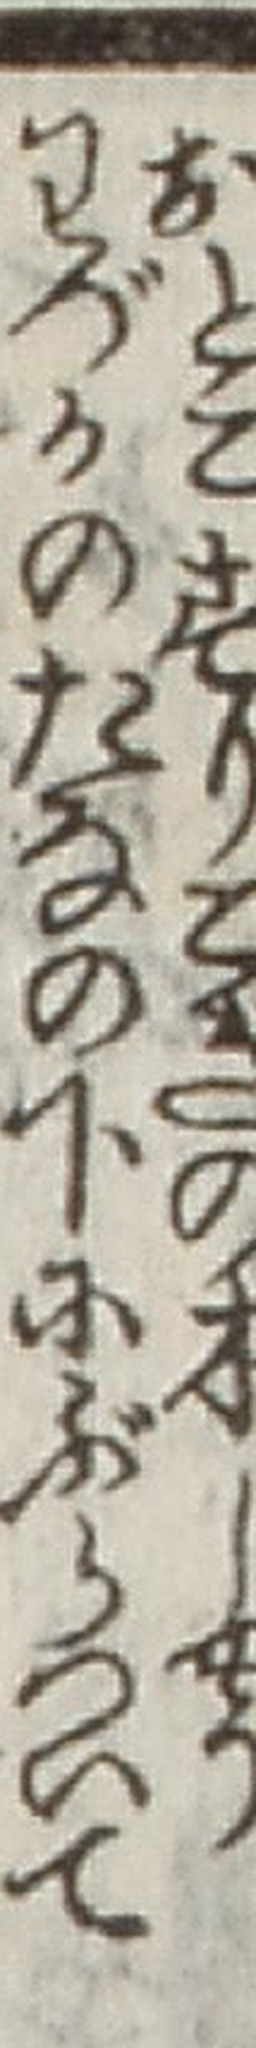わづかのたなの下にぶらついて
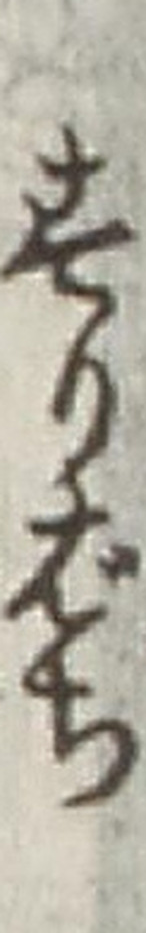すりばち
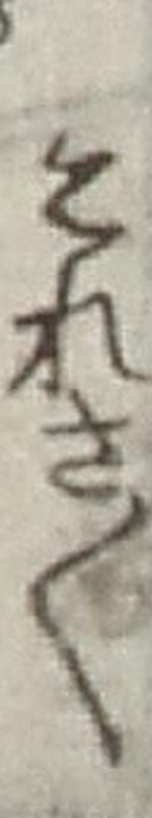これさ〳〵
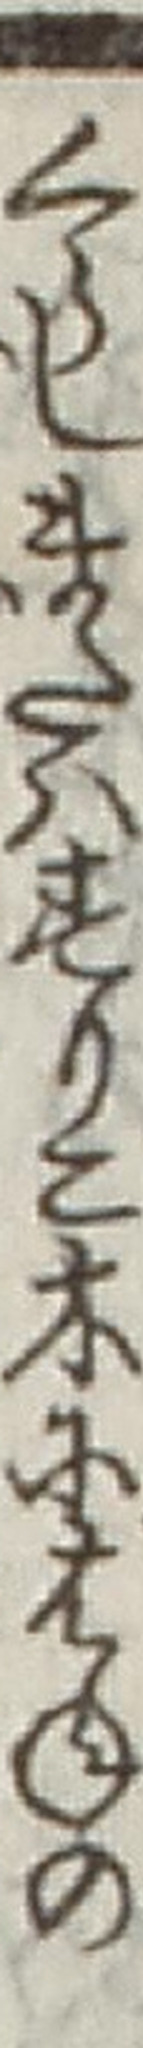くらしまたはすりこ木にはねの
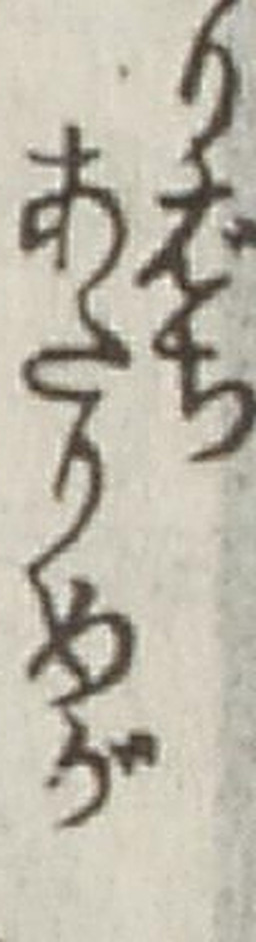あたりめが
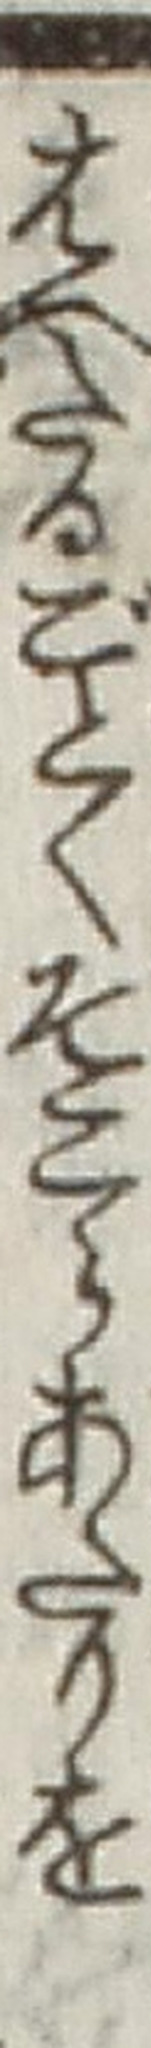はえたるごとくそこらあたりを
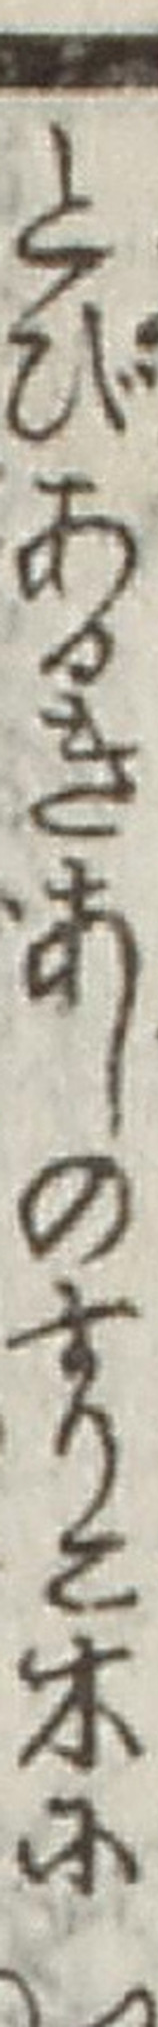とびあるきあしのすりこ木に
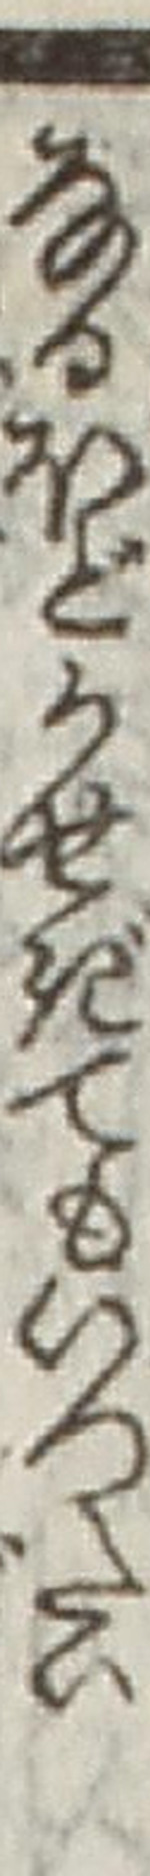なるほどかせぎてもいつたい
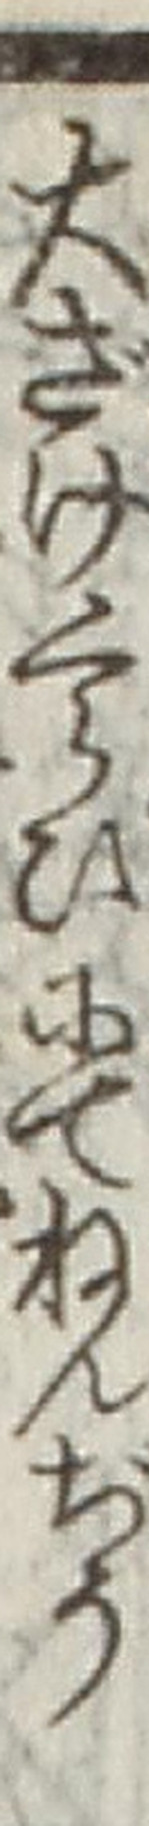大ざけくらいにてねんぢう
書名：三世相出雲當座帳　上下冊
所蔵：東京大学地震研究所図書室 Earthquake Research Institute Library, The University of Tokyo, JAPAN
